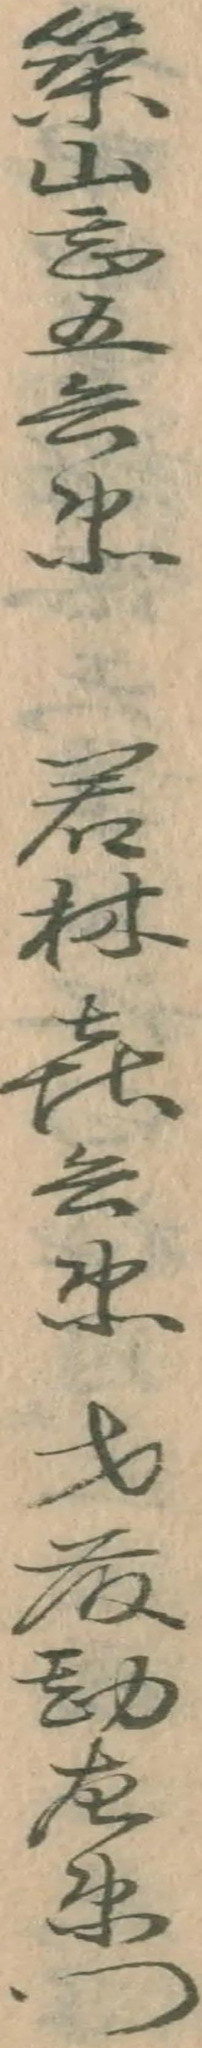築山甚五兵衛若林喜兵衛才藤勘左衛門

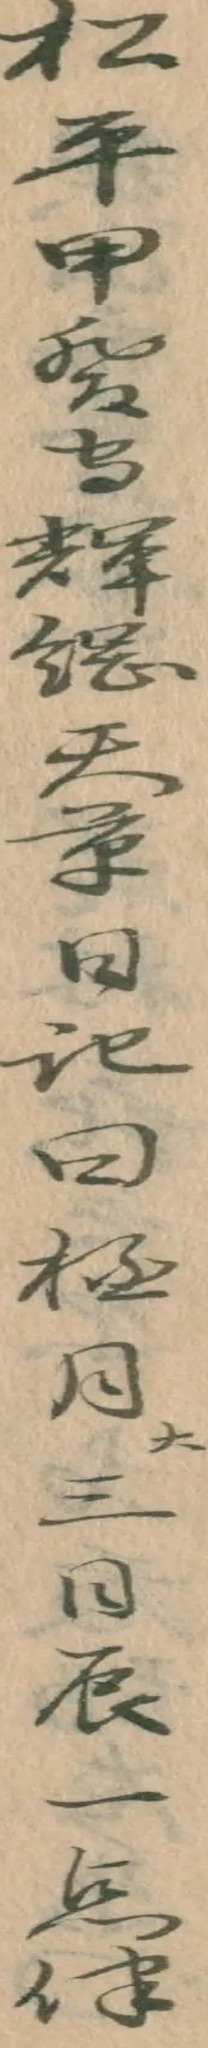松平甲斐守輝綱天草日記曰極月大三日辰一点伴
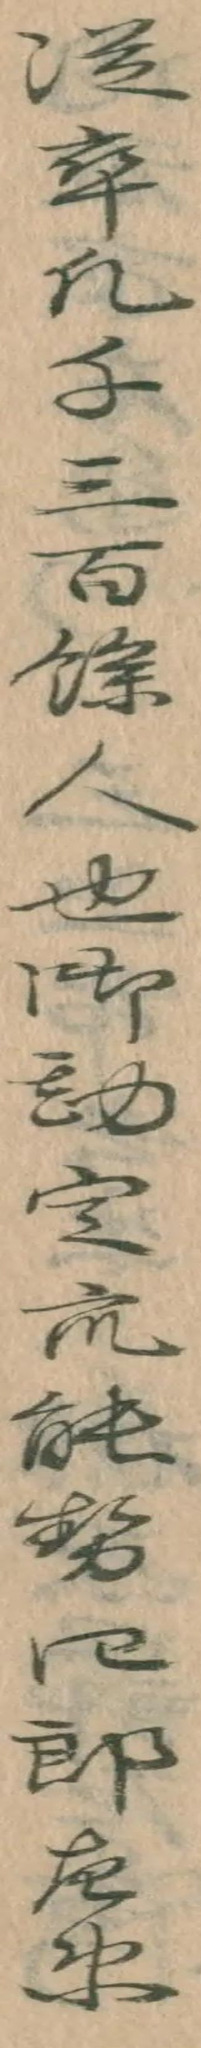従卒凡千三百余人也御勘定衆能勢四郎左衛
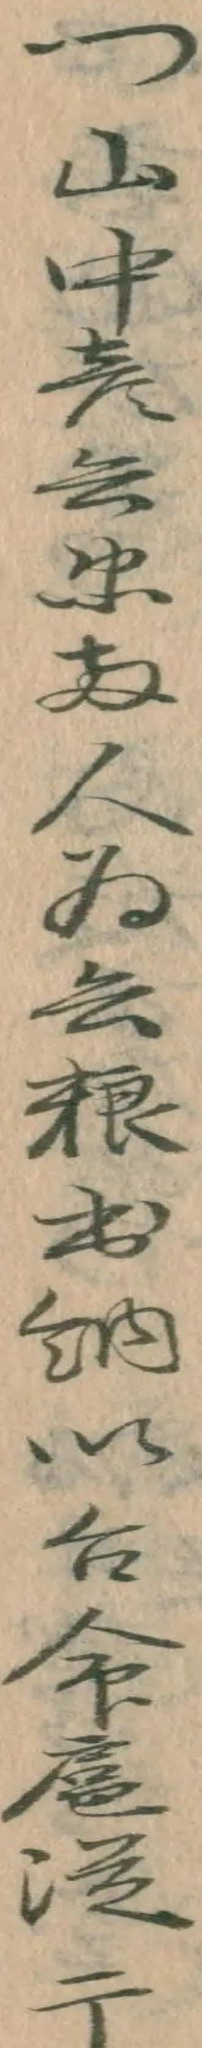門山中彦兵衛両人為兵粮出納以台命扈従于
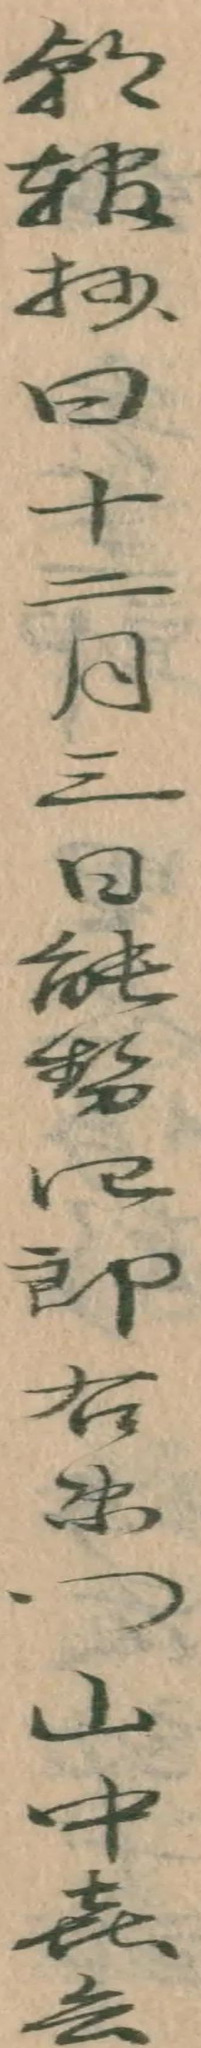朝報抄曰十二月三日能勢四郎右衛門山中喜兵
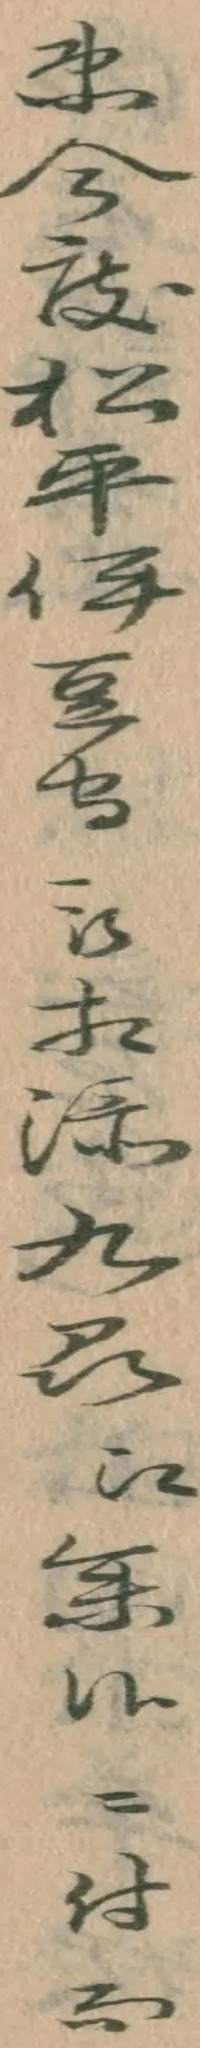衛今度松平伊豆守被相添九州江参候に付而
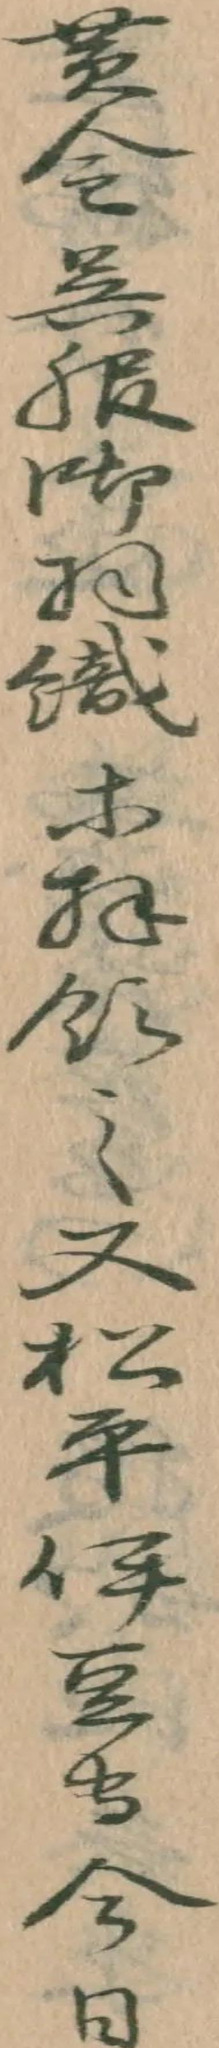黄金呉服御羽織等拝領之又松平伊豆守今日
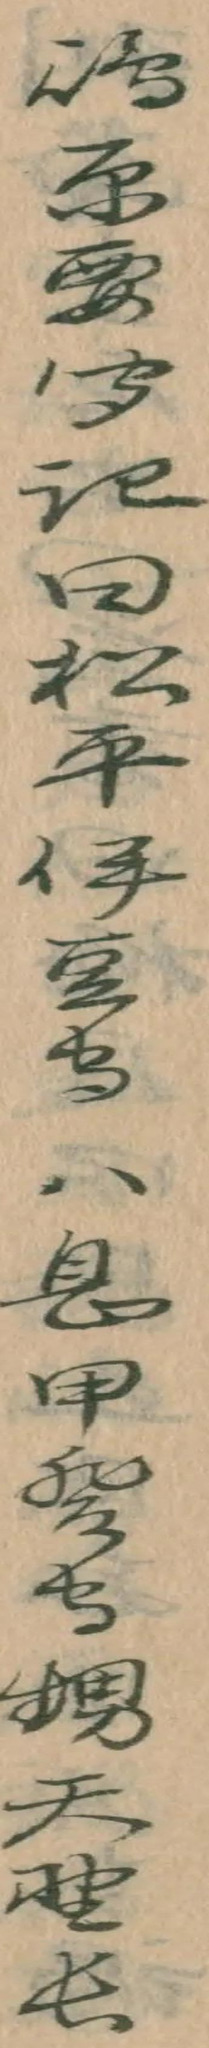島原要聞記曰松平伊豆守は息甲斐守甥天野長
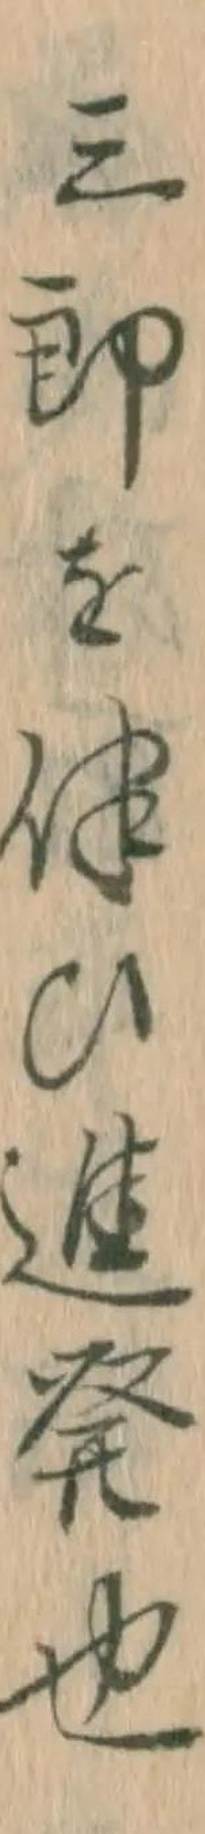三郎を伴ひ進発也
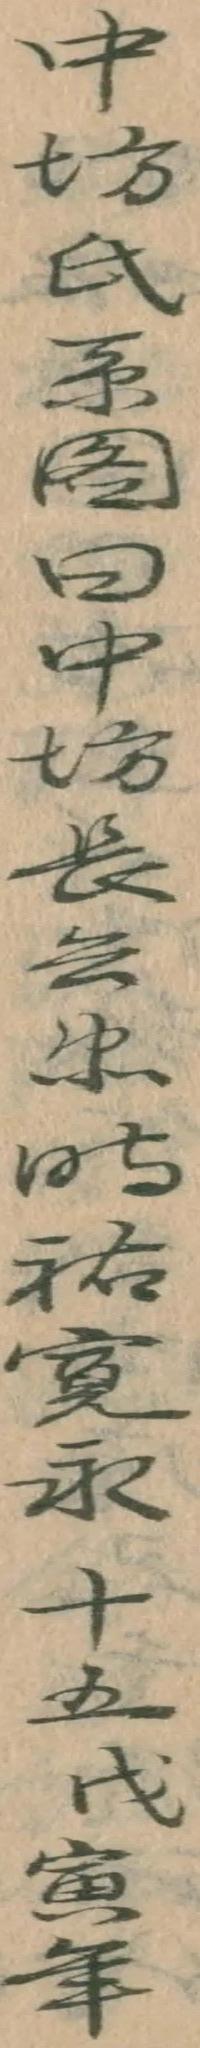中坊氏系図曰中坊長兵衛時祐寛永十五戊寅年
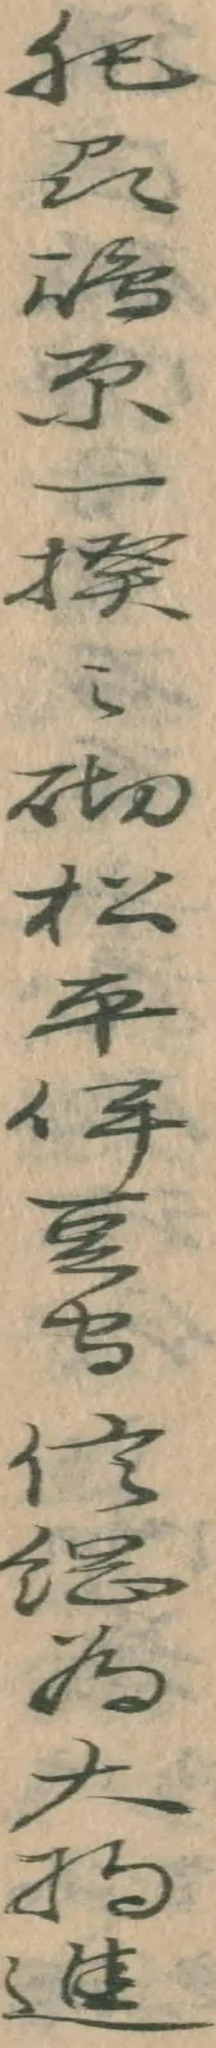肥州島原一揆之砌松平伊豆守信綱為大将進
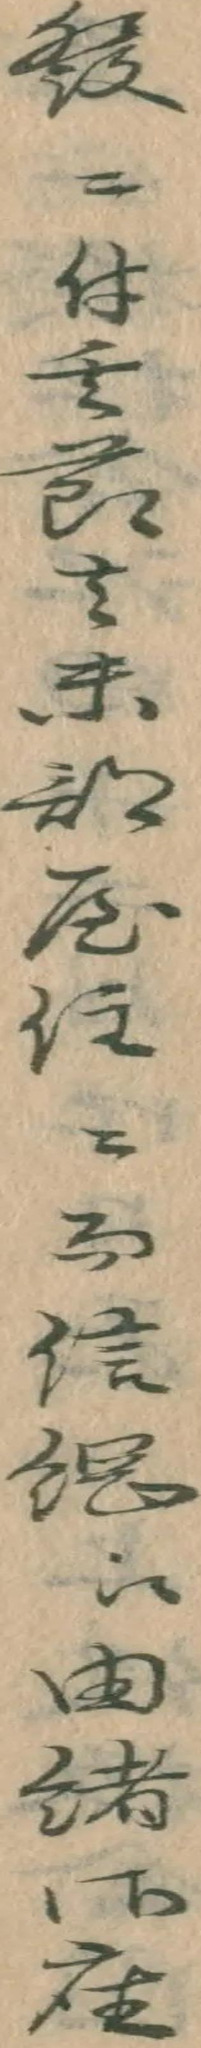発に付其節は未部屋住に而信綱江由緒御座
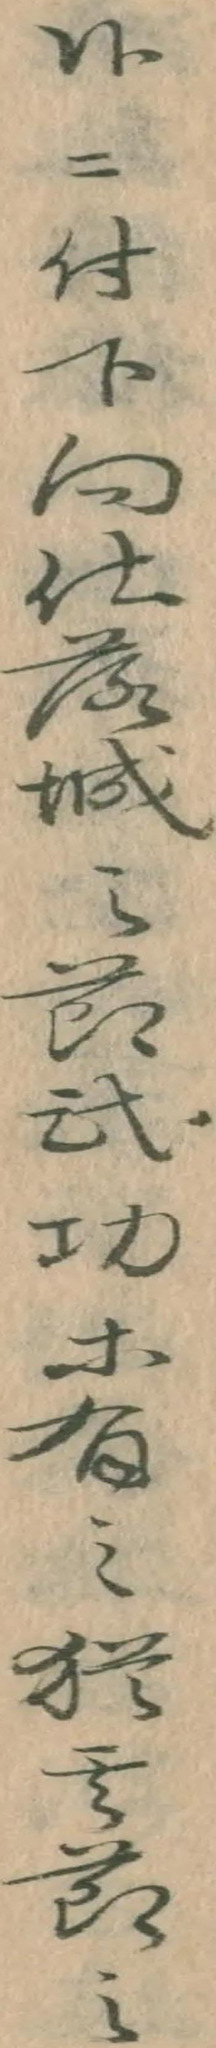候に付下向仕落城之節武功等有之猶其節之
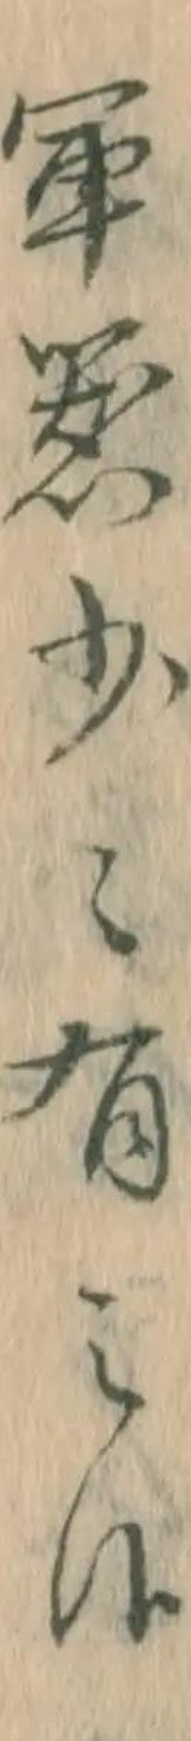軍器少々有之候
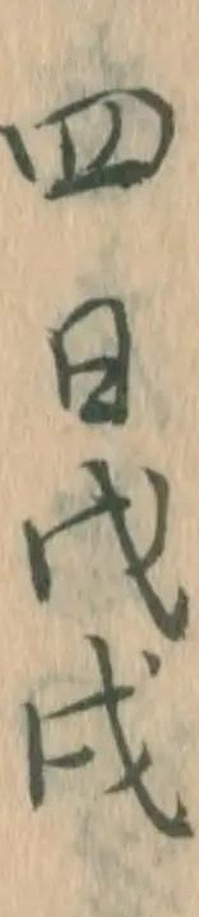四日戊戌

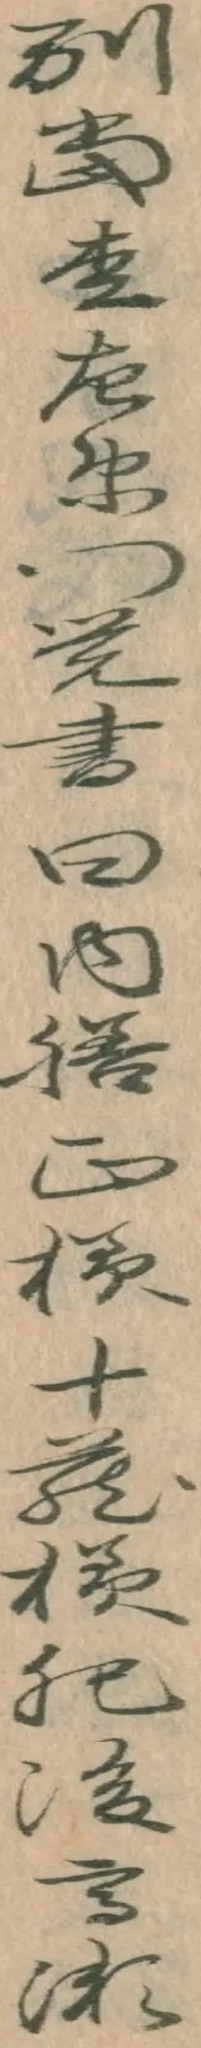別当杢左衛門覚書曰内膳正様十蔵様肥後高瀬
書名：切支丹御退治記 49巻. [3]
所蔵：国立国会図書館 National Diet Library, JAPAN
